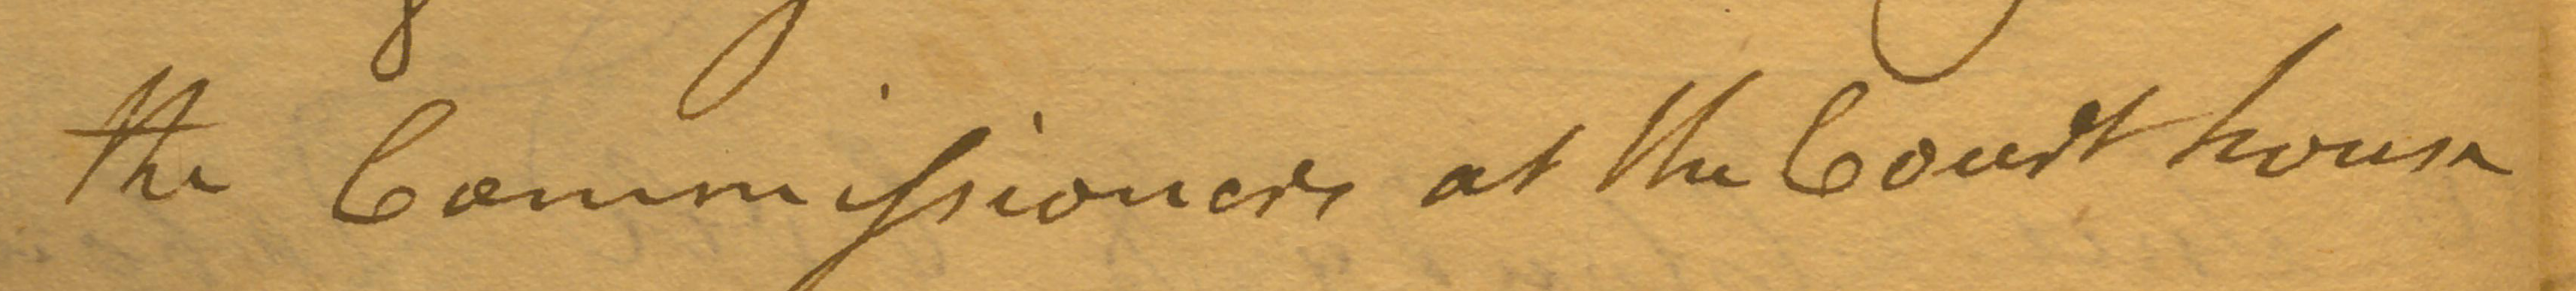the Commissioner, at the Court house
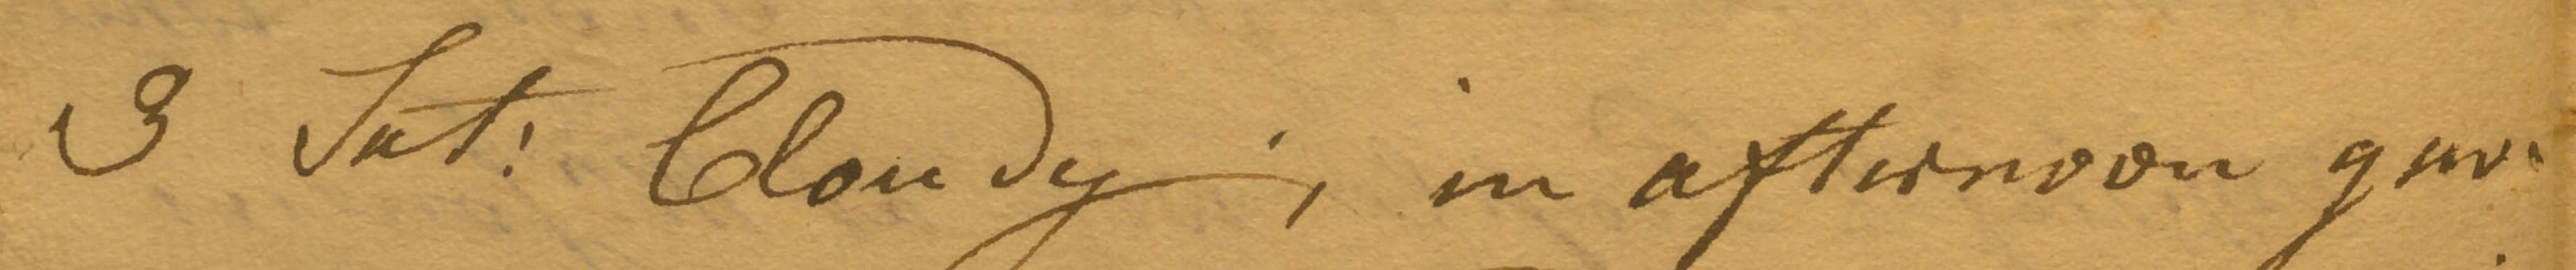3 Sat: Cloudy, in afternoon gave
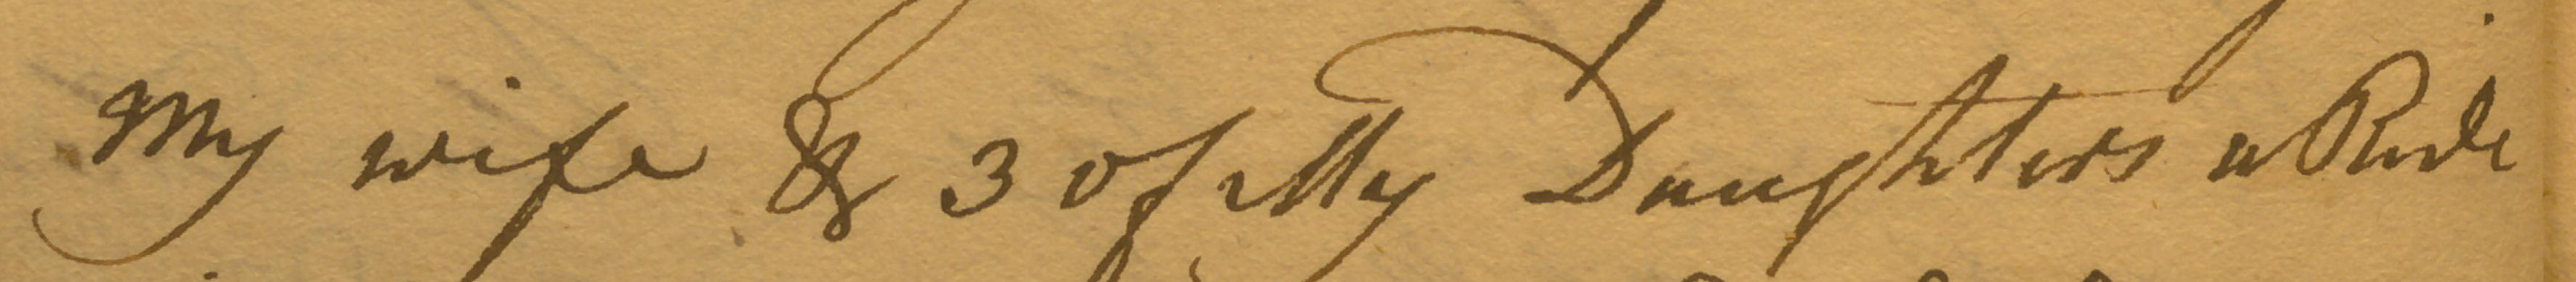my wife & 3 of My Daughters a RIde
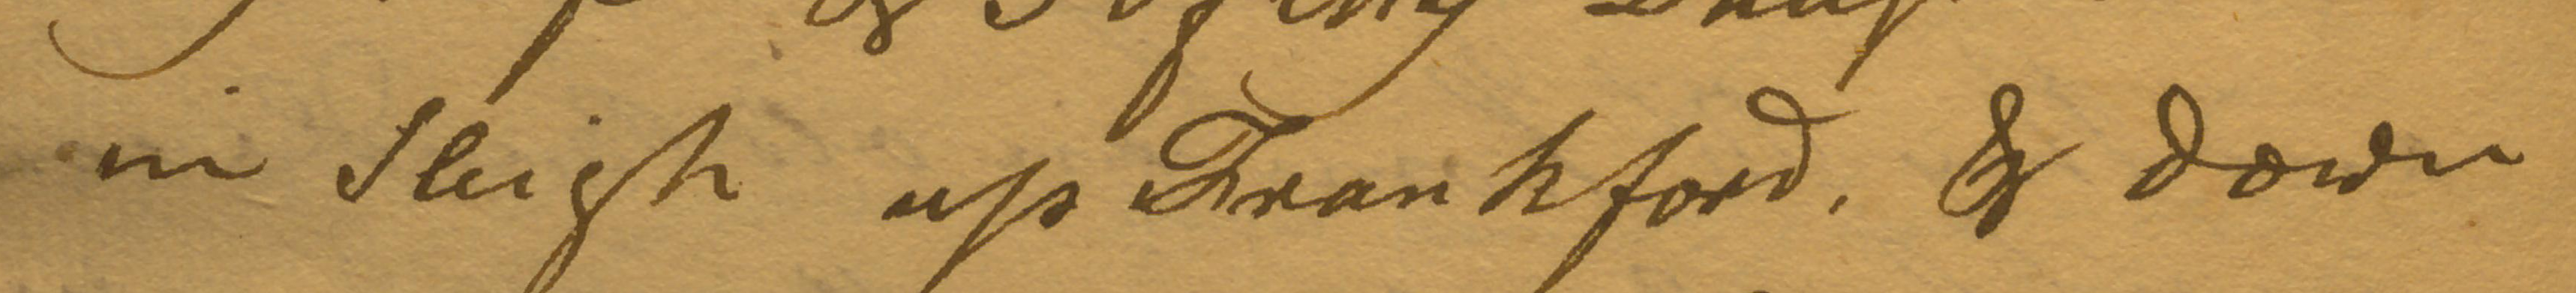in Sleigh up Frankford. & down
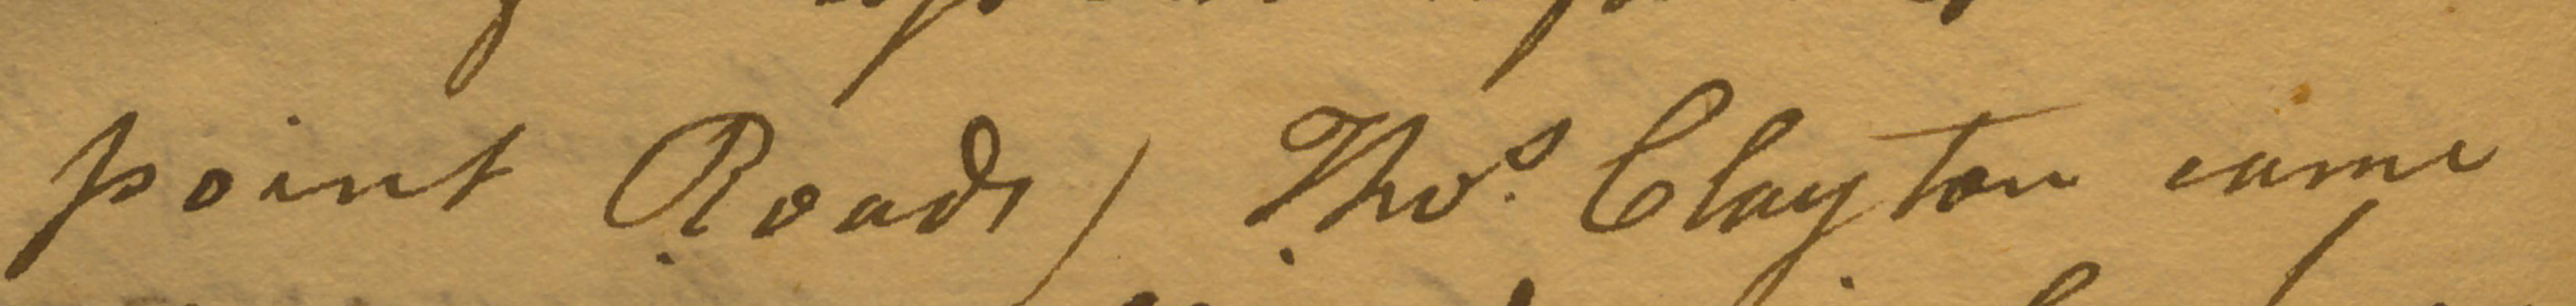point Roads) Tho^s. Clayton came
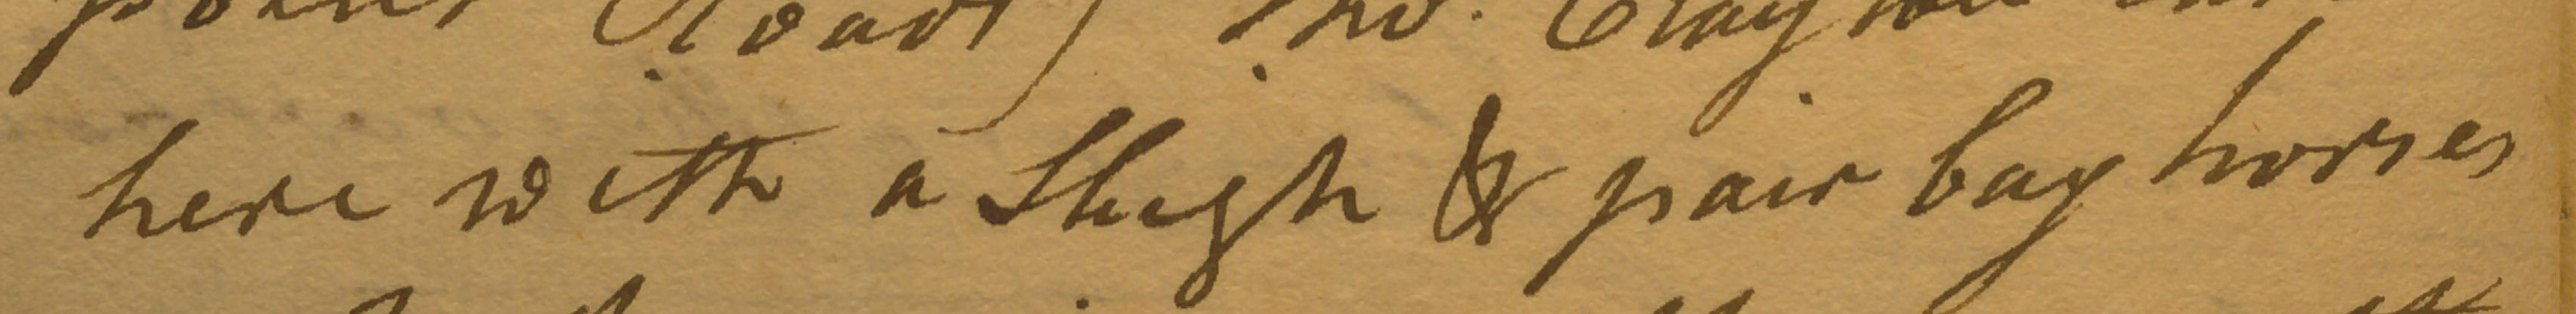here with a sleigh & pair bay horses
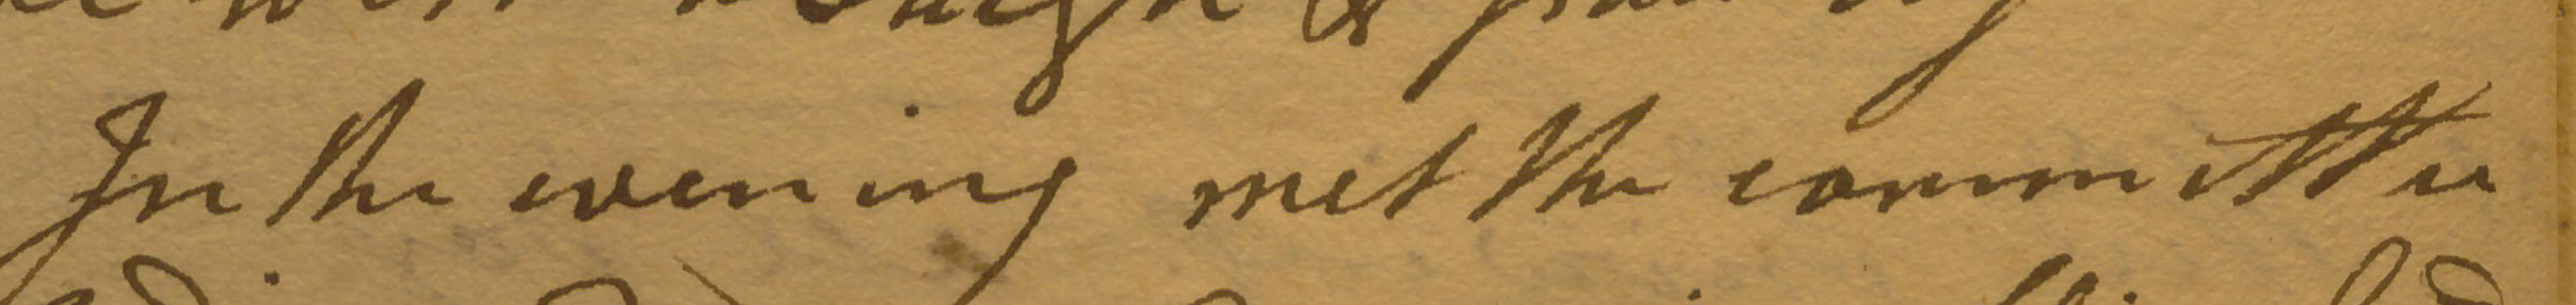In the evening met the committe
